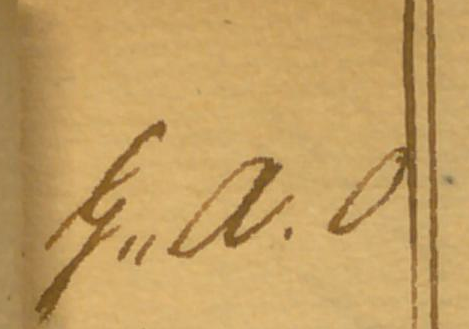G. A. O
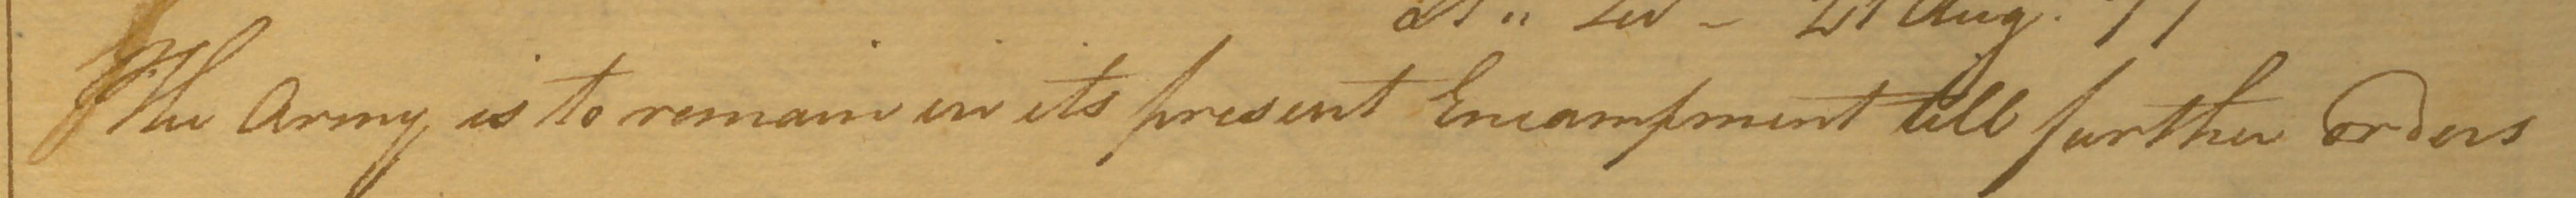The Army is to remain in its present Encampment till further orders
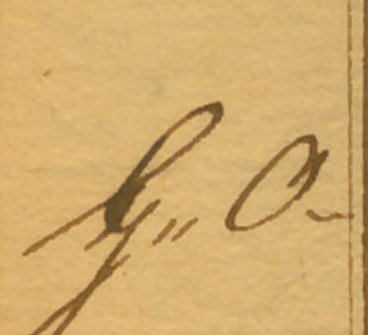G. O.
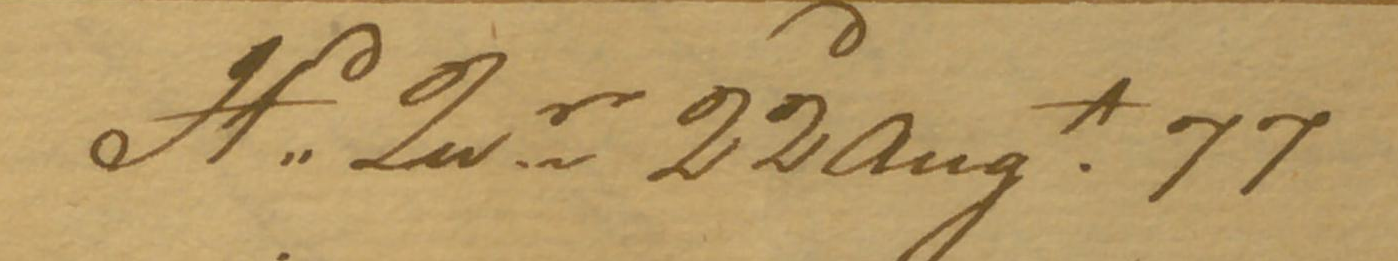H^d. Qu^rs. 22^d Aug^t. 77
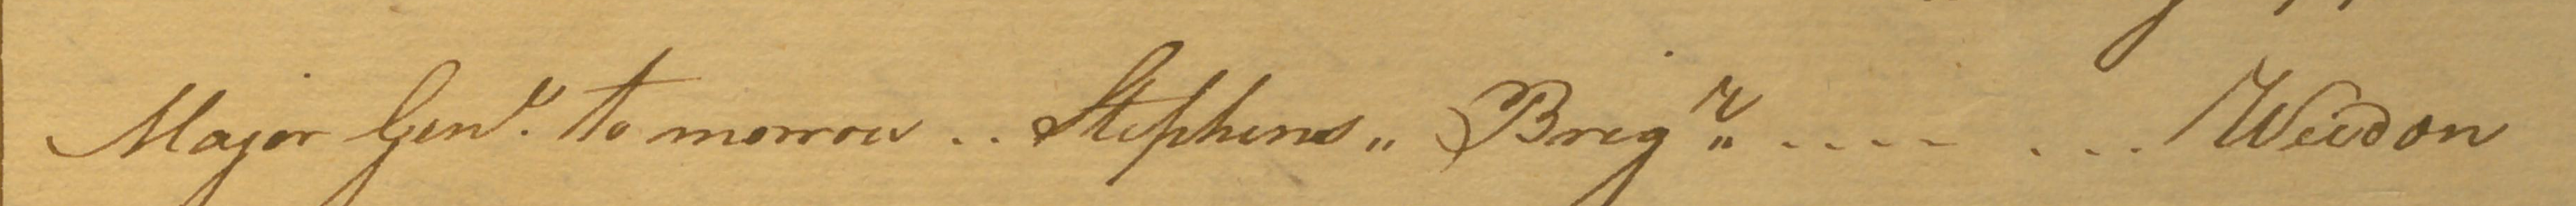Major Gen^l. to morrow.. Stephens. Brig^r. .... ... Weedon
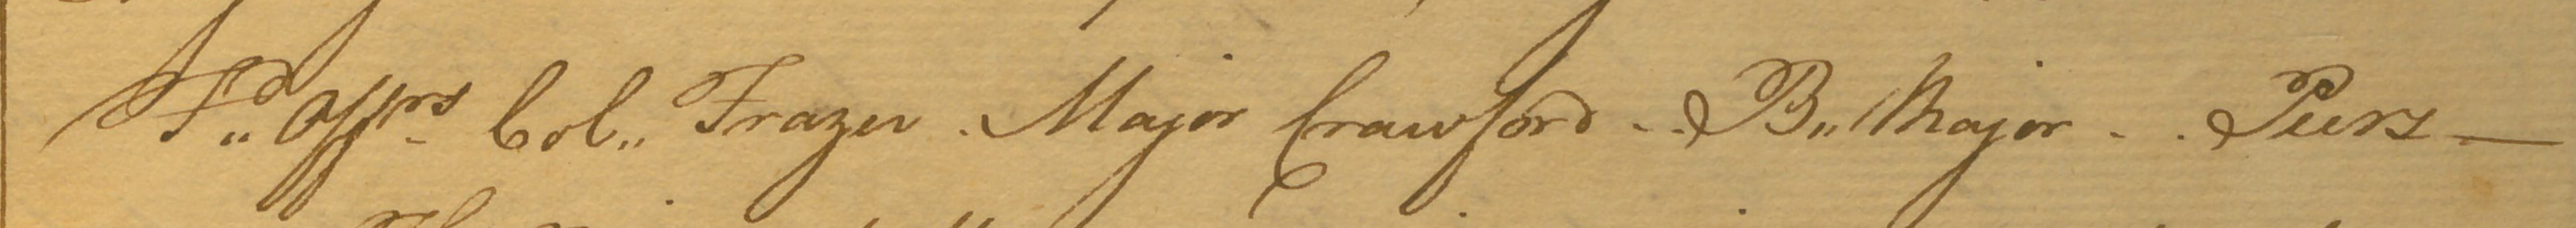F^d. Off^rs. Col. Frazer Major Crawford.. B. Major.. Peers-
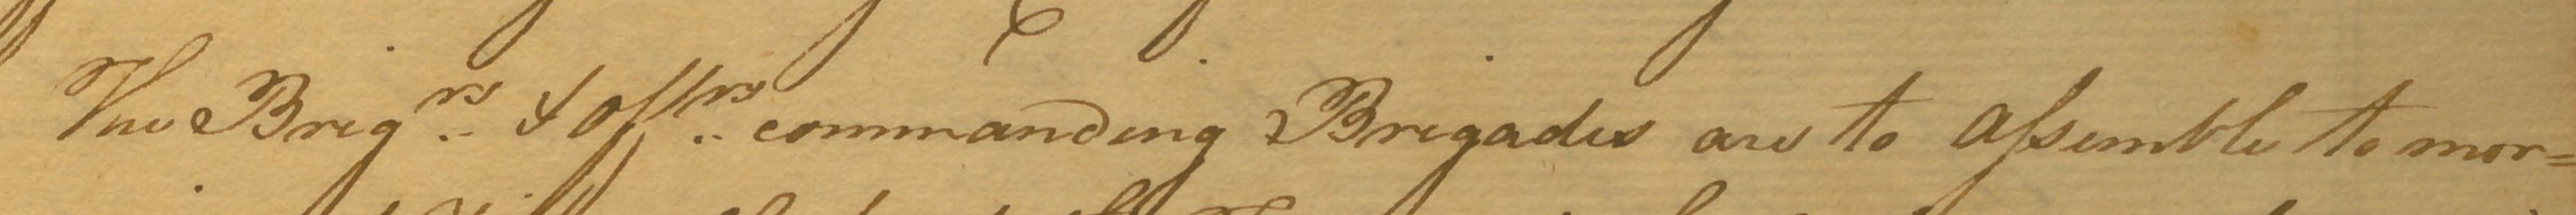The Brig^rs. & Off^rs. commanding Brigades are to assemble tomor-
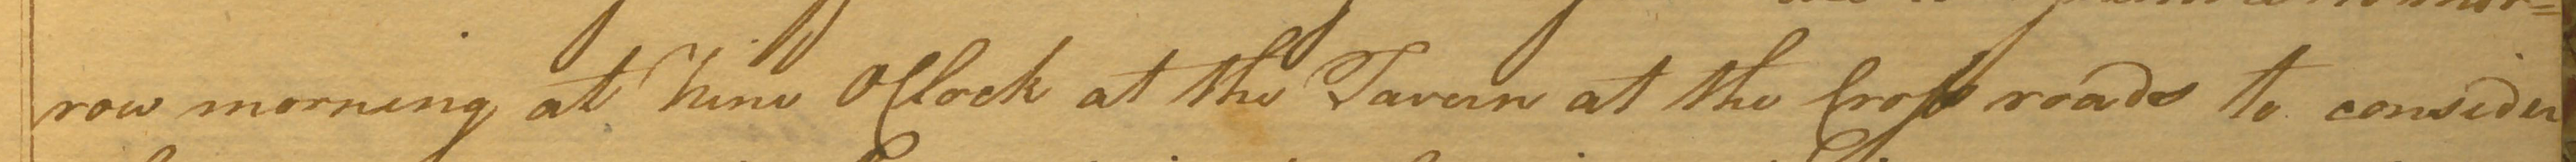row morning at nine oClock at the Tavern at the Crossroads to consider
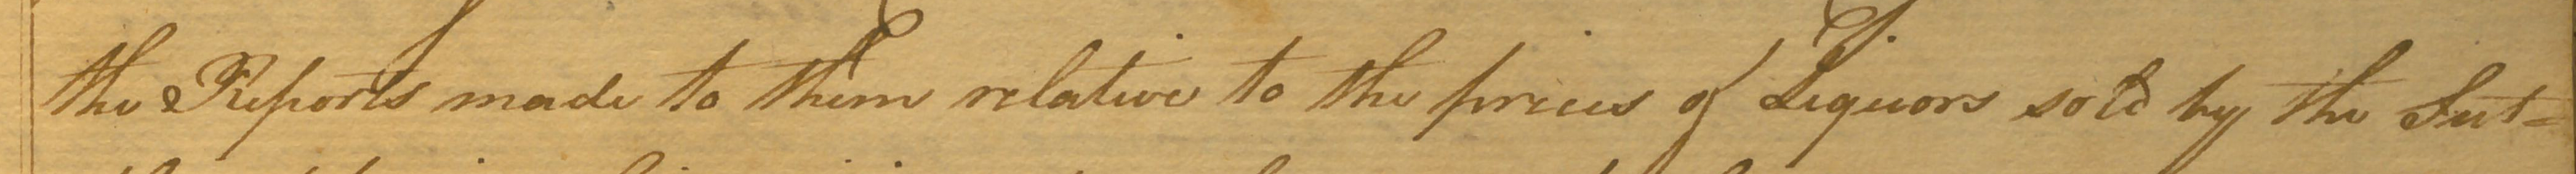the Reports made to them relative to the prices of Liquors sold by the Sut-
